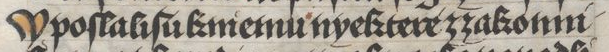Y poſlaliſu knienu nyekteré zzakonní¬
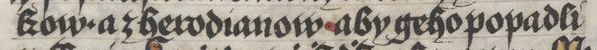kow.a zherodianow.aby geho popadli
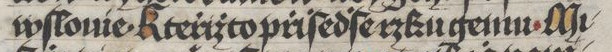wſlouie.Kteṙíżto pṙiẛedẛe rzku gemu.A
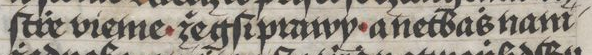ſtṙe vieme.že gſi prawy.a netbaṡ nam
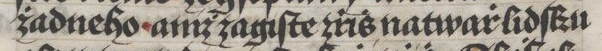żadneho.aniż zagiſte zṙíṡ natwáṙ lidſku
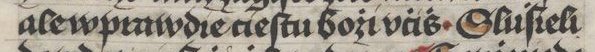ale wprawdie cieſtu boží vċiṡ.Sluẛieli
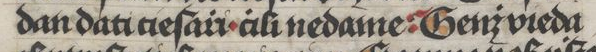dati dati cieſaṙi.ċili nedame?Genż vieda
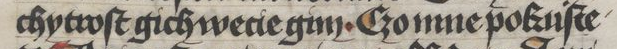chytroſt gich wecie gim.Czo mne pokuẛie¬
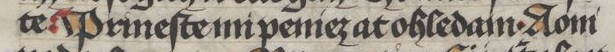te?Prineſte mi peniez at ohledam.A oni
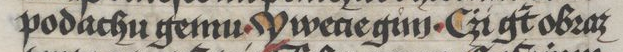podachu gemu.Y wecie gim.Cżí ḡt obraz
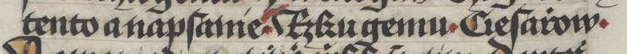tento a napſaníe?Rzku gemu.Cieſaṙow.
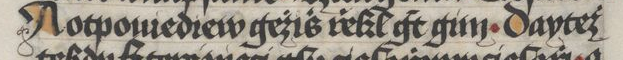A otpouediewo geżíṡ ṙekl ḡt gim.Dayteż
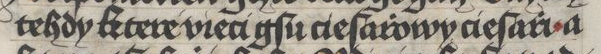tehdy které wieci gſu cieſaṙowy cieſaṙi.a
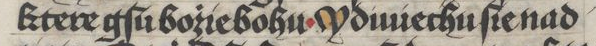ktere gſu bożíe bohu.Ydiuiechu ſie nad
